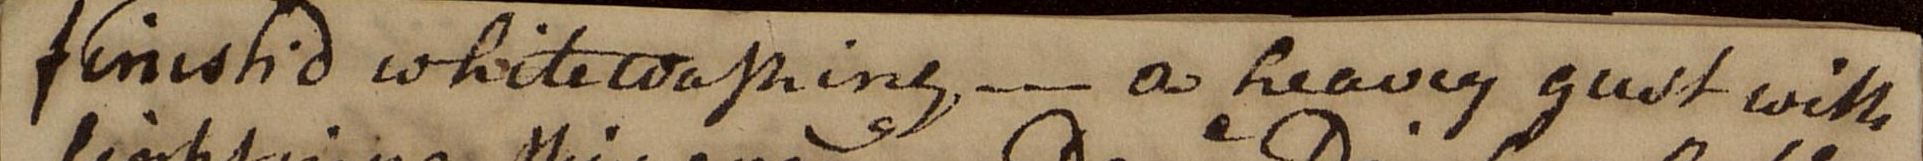finish'd whitewasing,- a heavy gust with
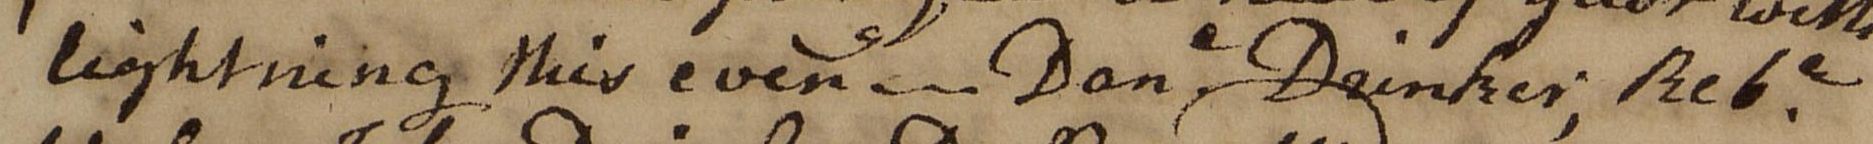lightning this even^g- Dan^l. Drinker; Reb^a.
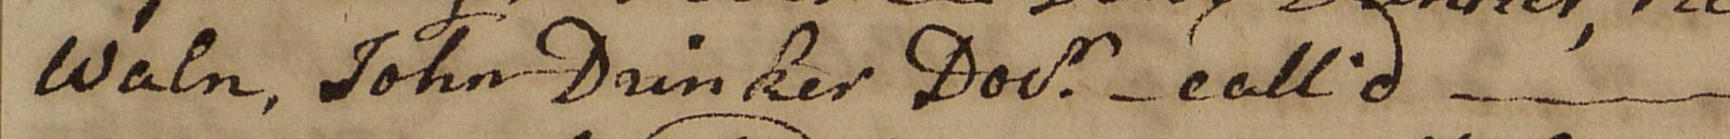Waln, John Drinker Doc^r.- call'd-
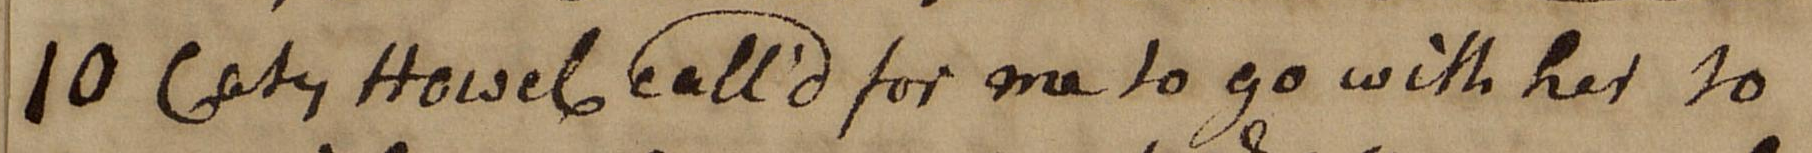10 Caty Howel call'd for me to go with her to
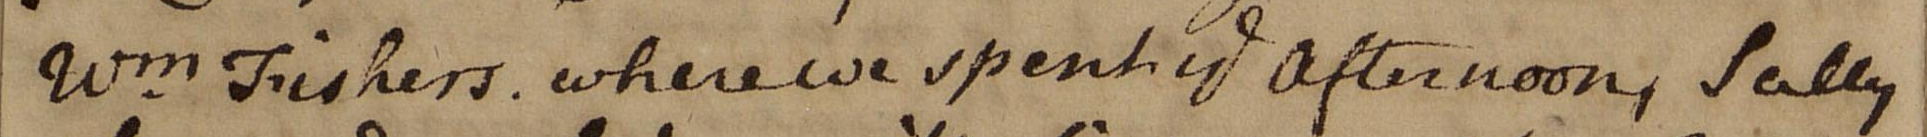W^m. Fishers. where we spent y^e Afternoon, Sally
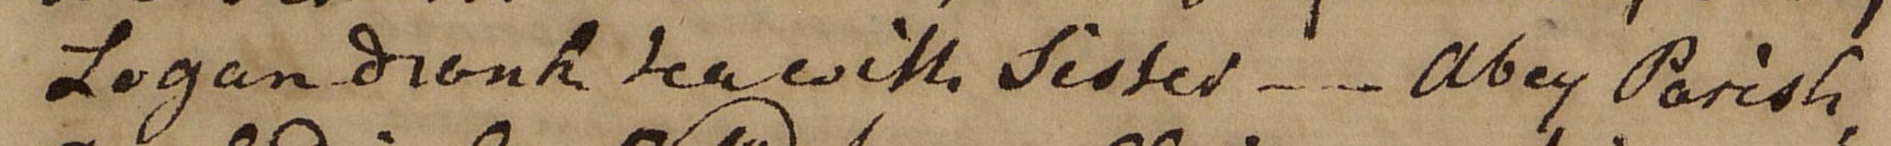Logan drank tea with Sister-- Abey Parish,
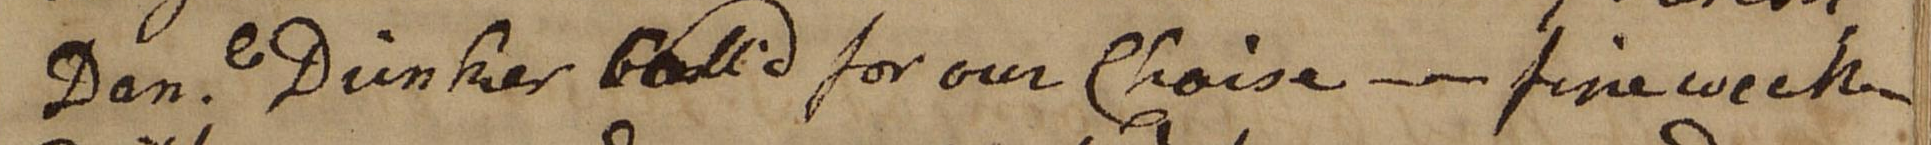Dan^l. Drinker call'd for our Chaise- fine week-
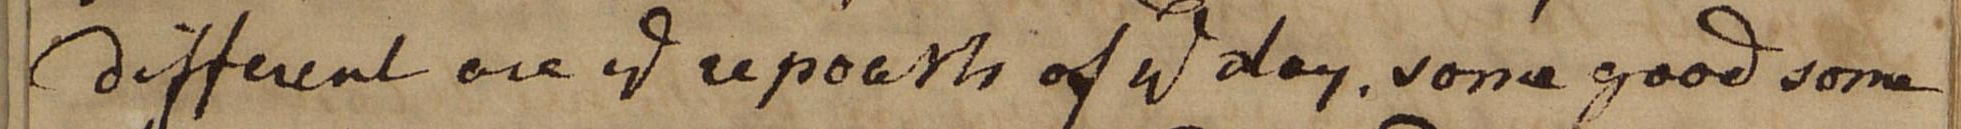different are y^e repoarts of y^e day, some good some
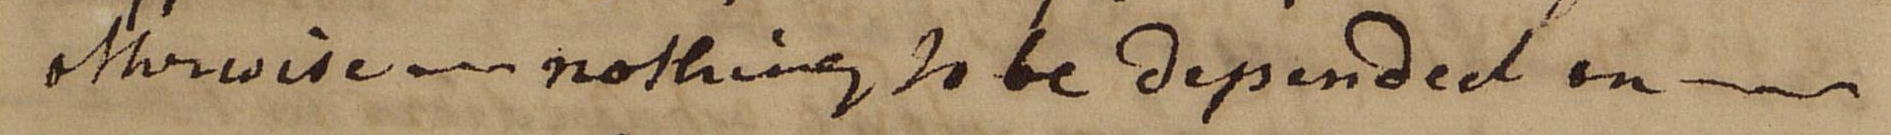otherwise- nothing to be dependet on-
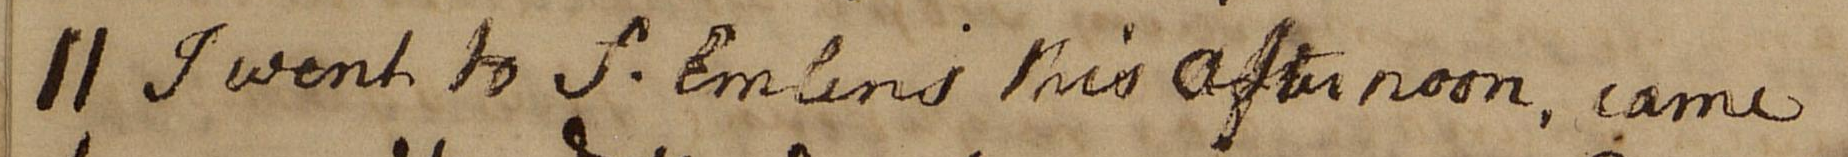11 I went to S. Emlens this afternoon, came
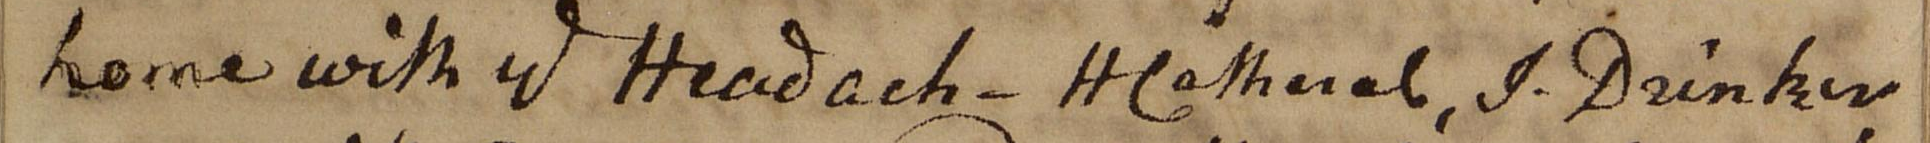home with y^e Head ach- H Catheral, I. Drinker
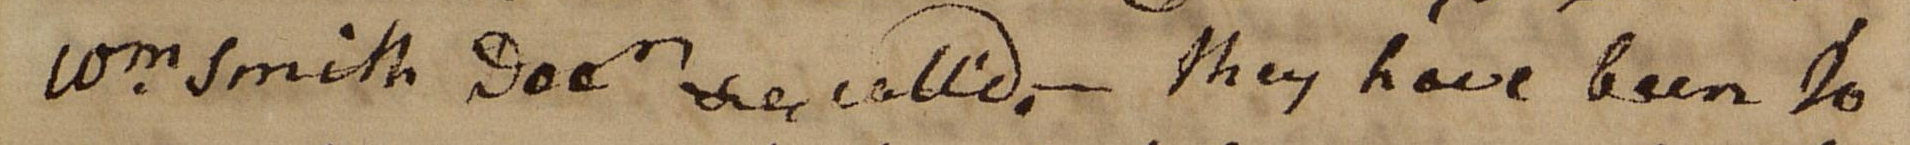W^m. Smith Doc^r &c call'd- they have been to
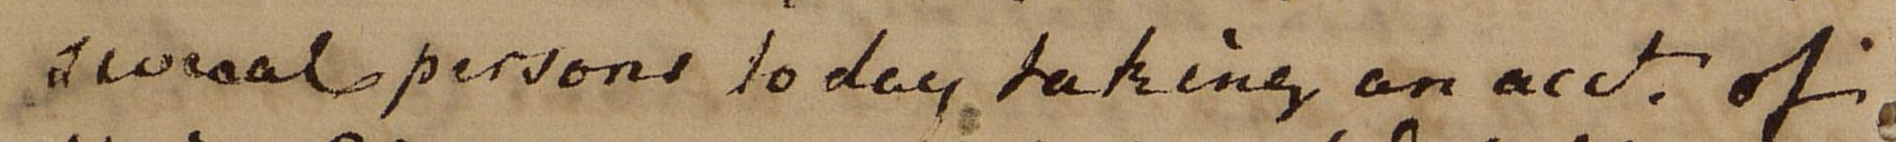several persons to day taking an acc^t. of
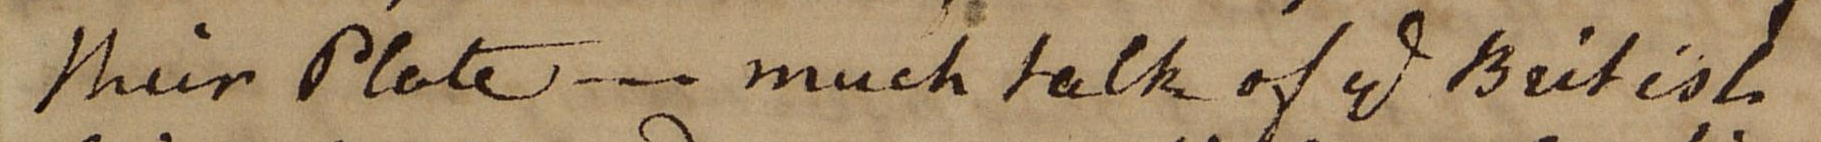theer Plate- much talk of y^e British
